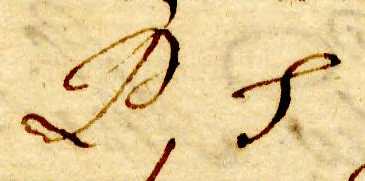P.S
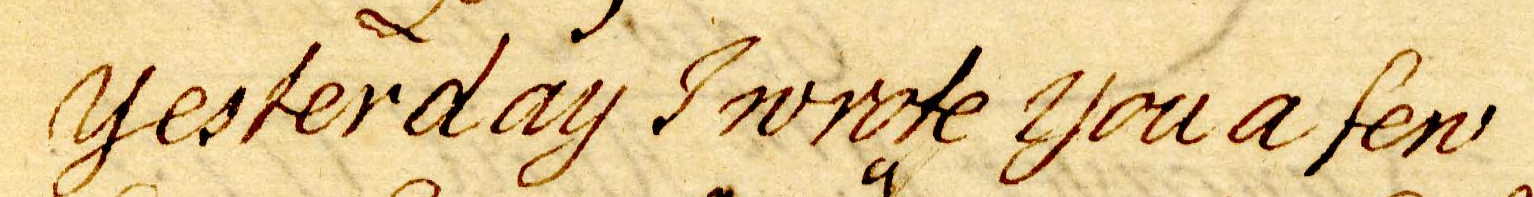Yesterday I wrote You a few
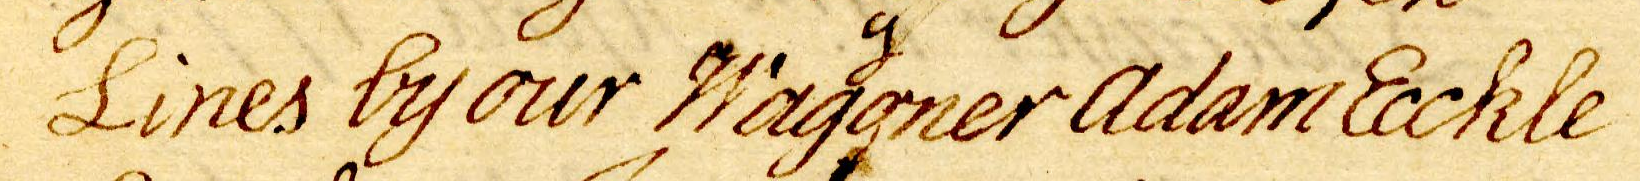Lines by our Wagoner Adam Ecckle
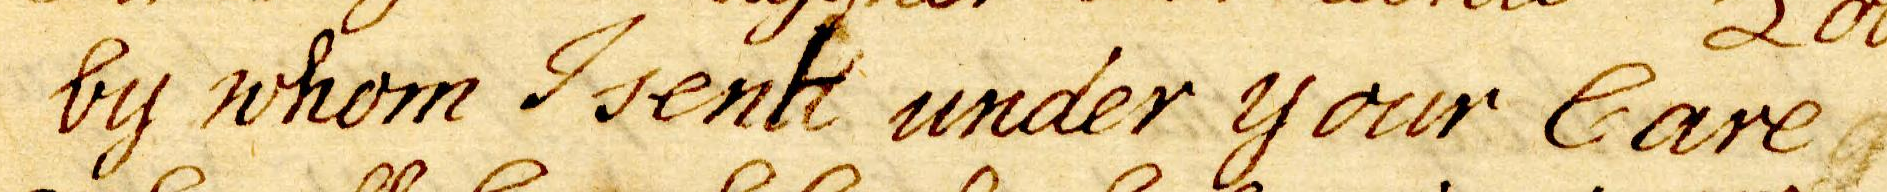by whom I sent under Your Care,
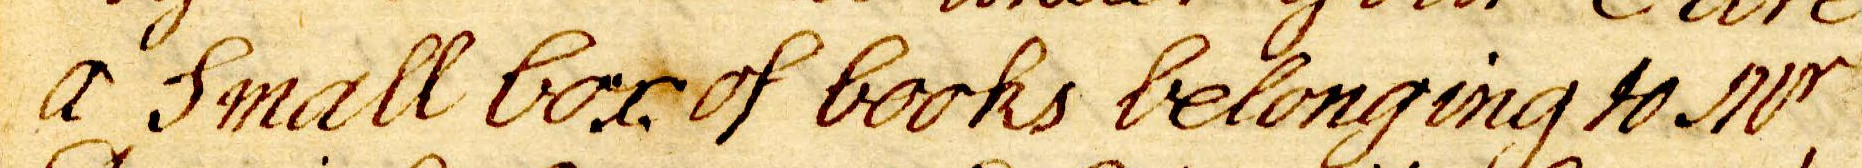a Small box of books belonging to M^r
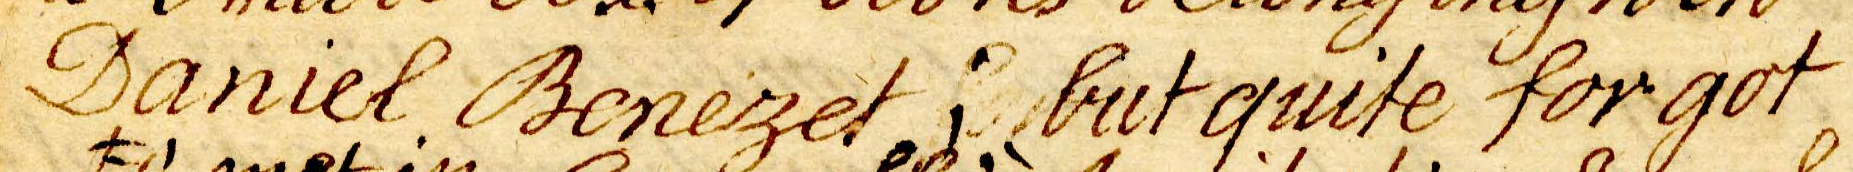Daniel Benezet; but quite forgot
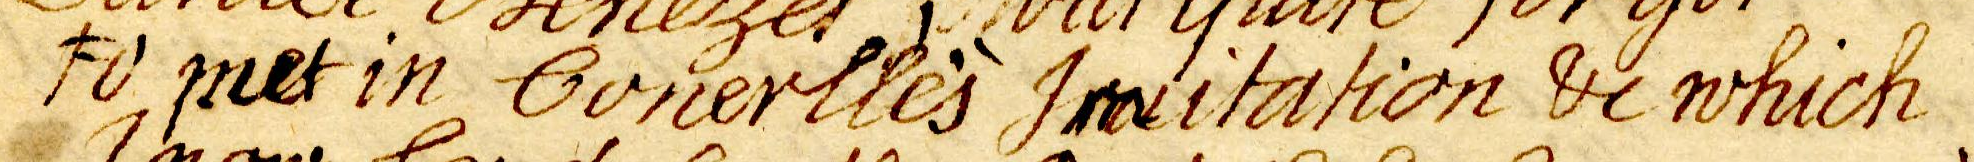to met in Conerlle's Imitation &c which
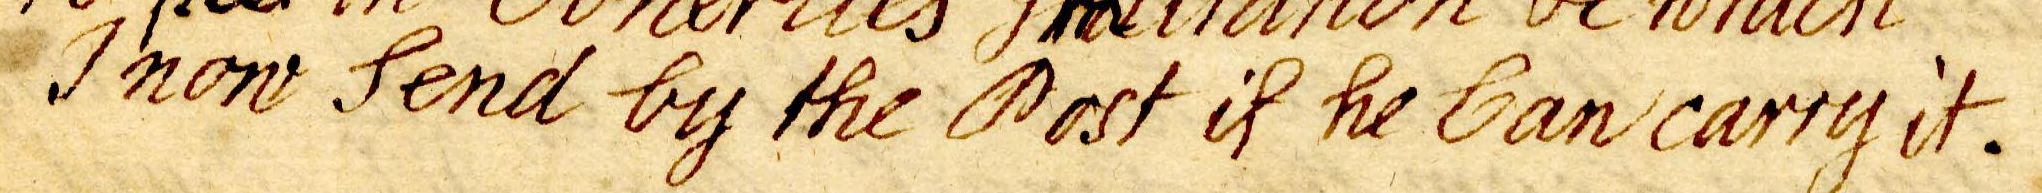I now Send by the Post if he Can carry it.
